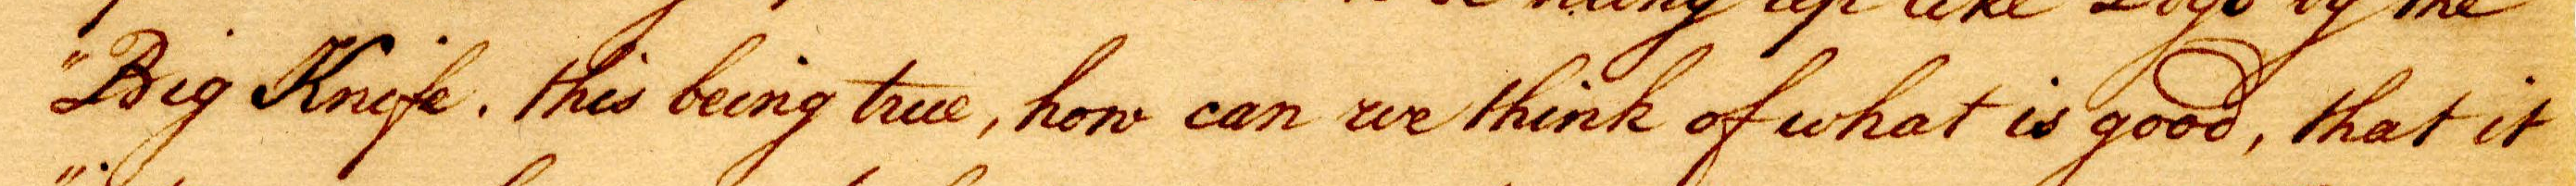"Big Knife. this being true, how can we think of what is good, that it
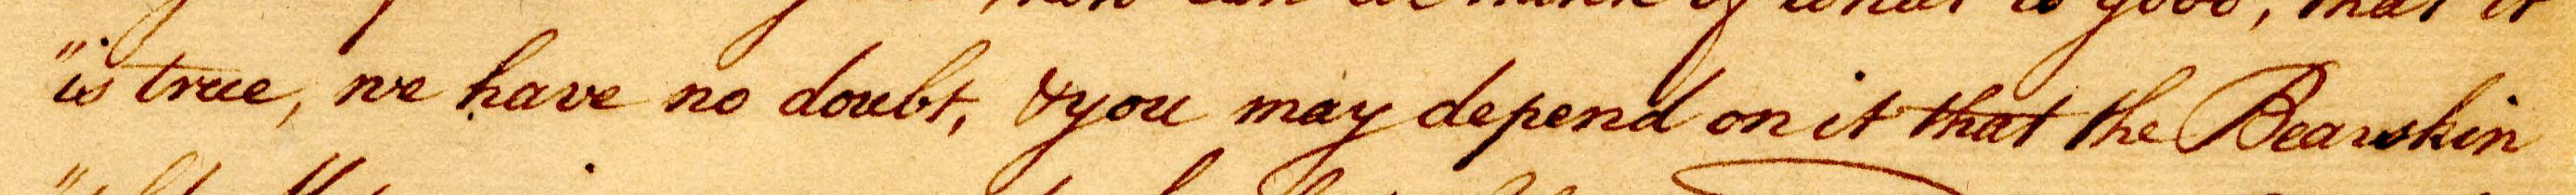"is true, we have no doubt, & you may depend on it that the Bearskin
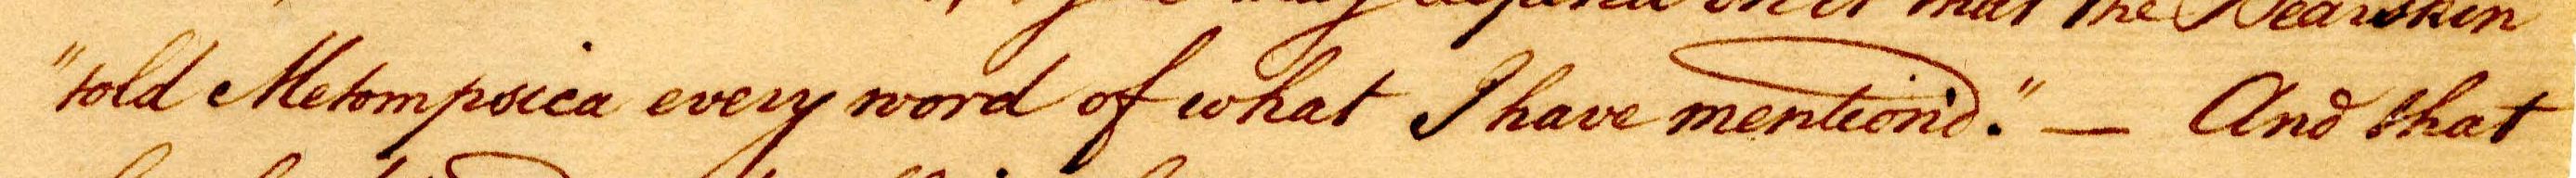"told Metompsica every word of what I have mention'd."- And that
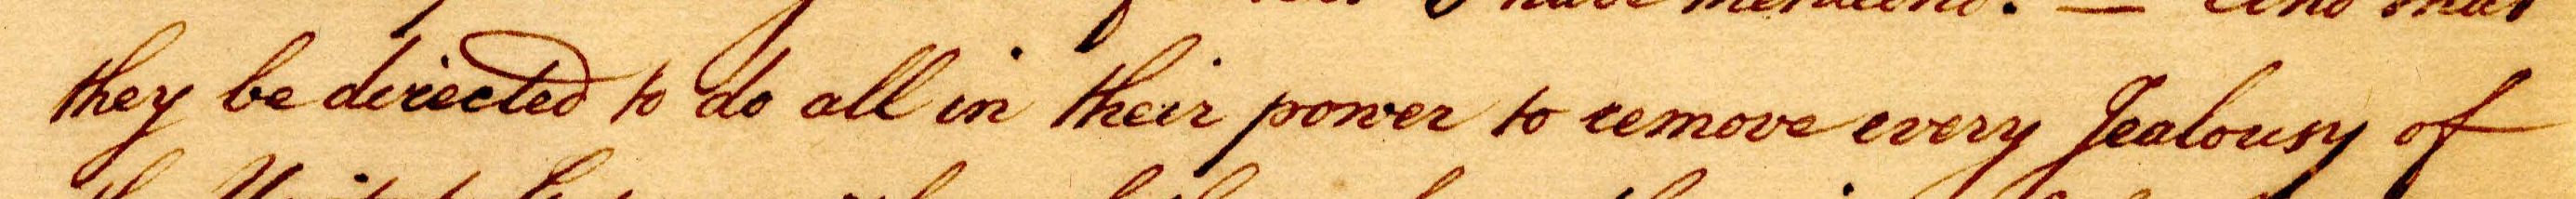they be directed to do all in their power to remove every Jealousy of
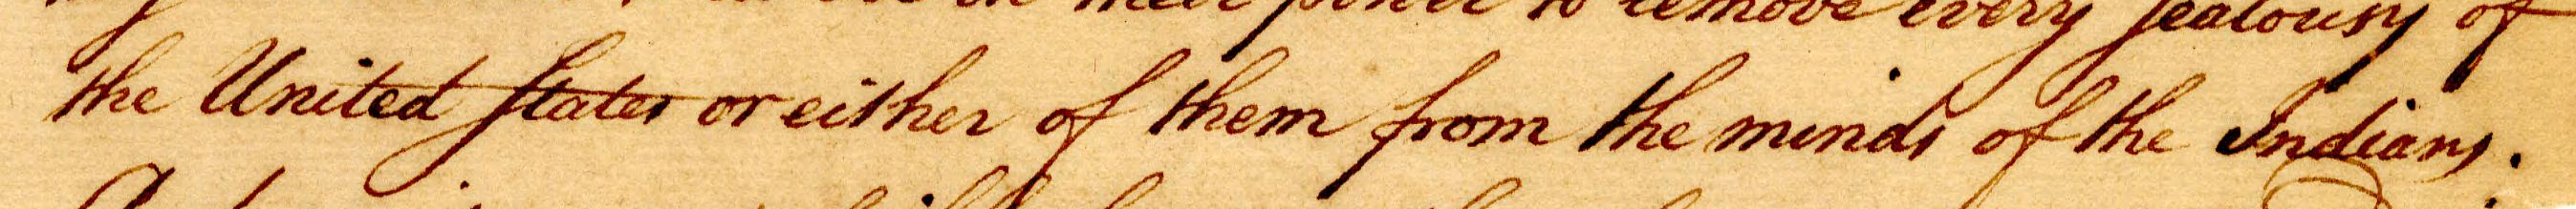the United States or either of them from the minds of the Indians.
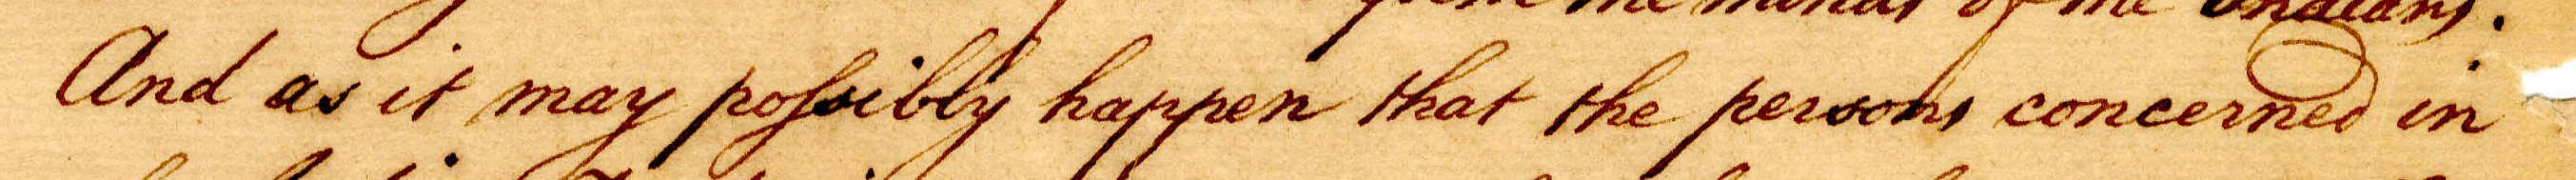And as it may possibly happen that the persons concerned in
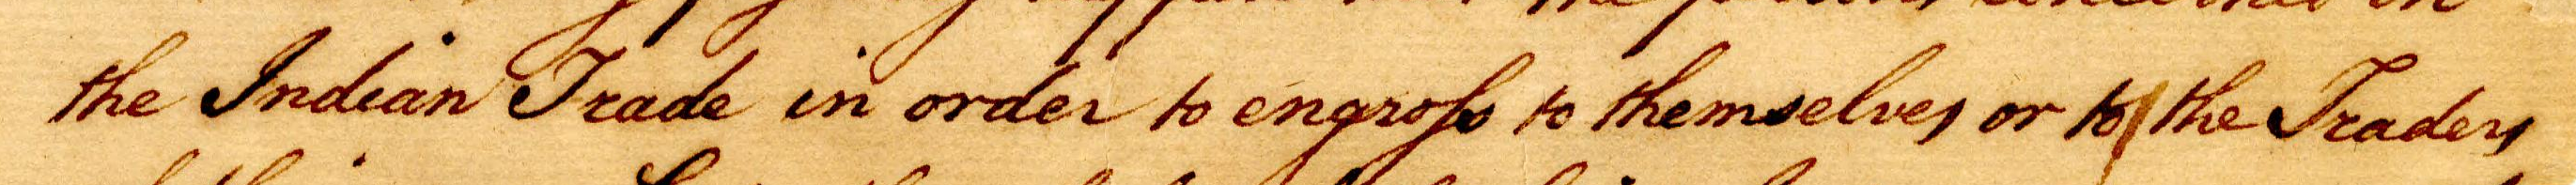the Indian Trade in order to engross to themselves or to the Traders,
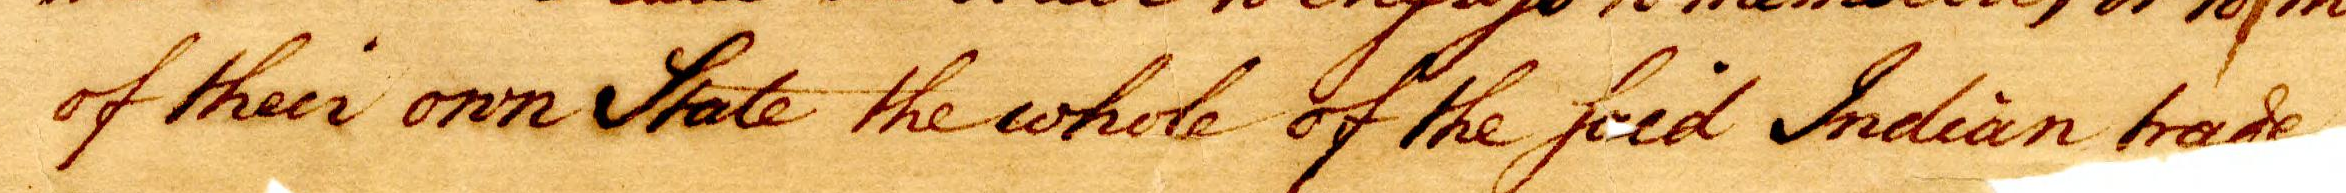of their own State the whole of the said Indian trade
